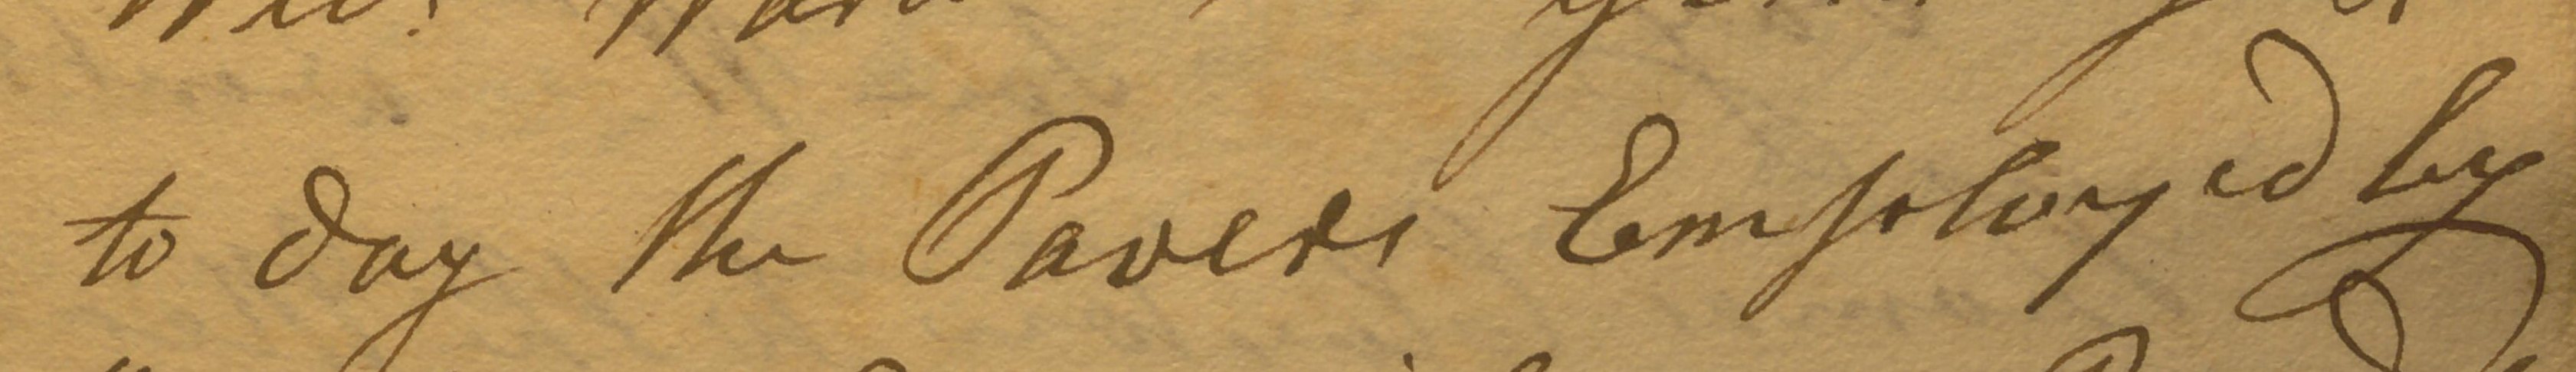to day the Pavers Employed by
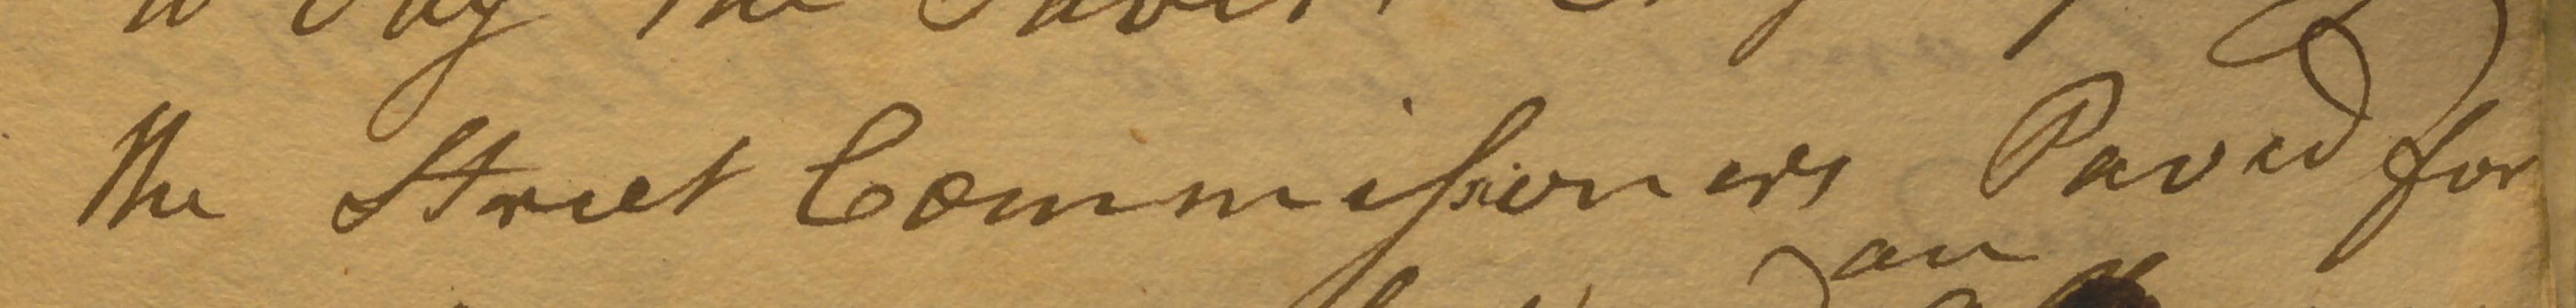the Street Commesoners Paved for
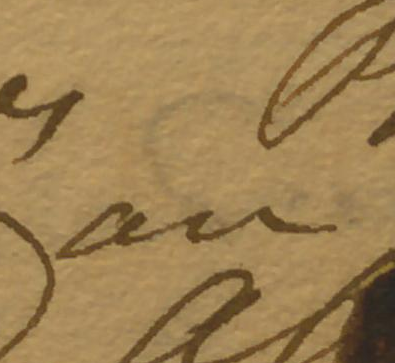an
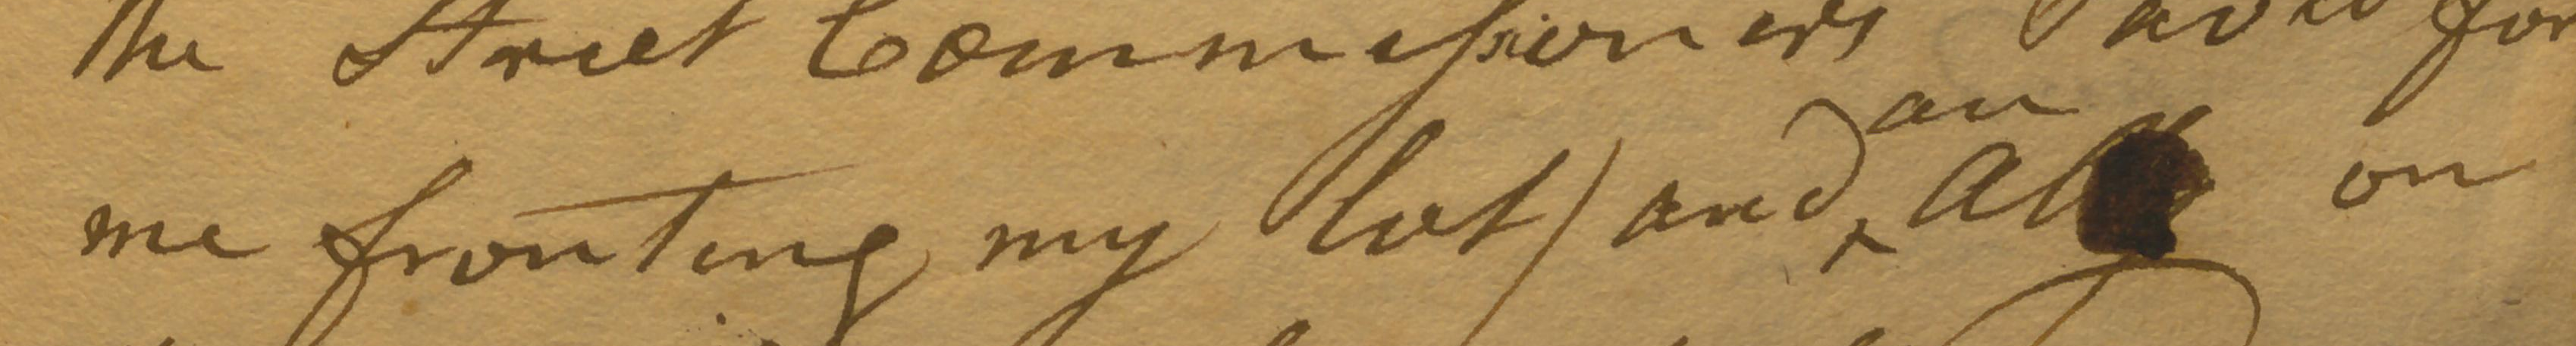me fronting my lot) and ^ Ally on
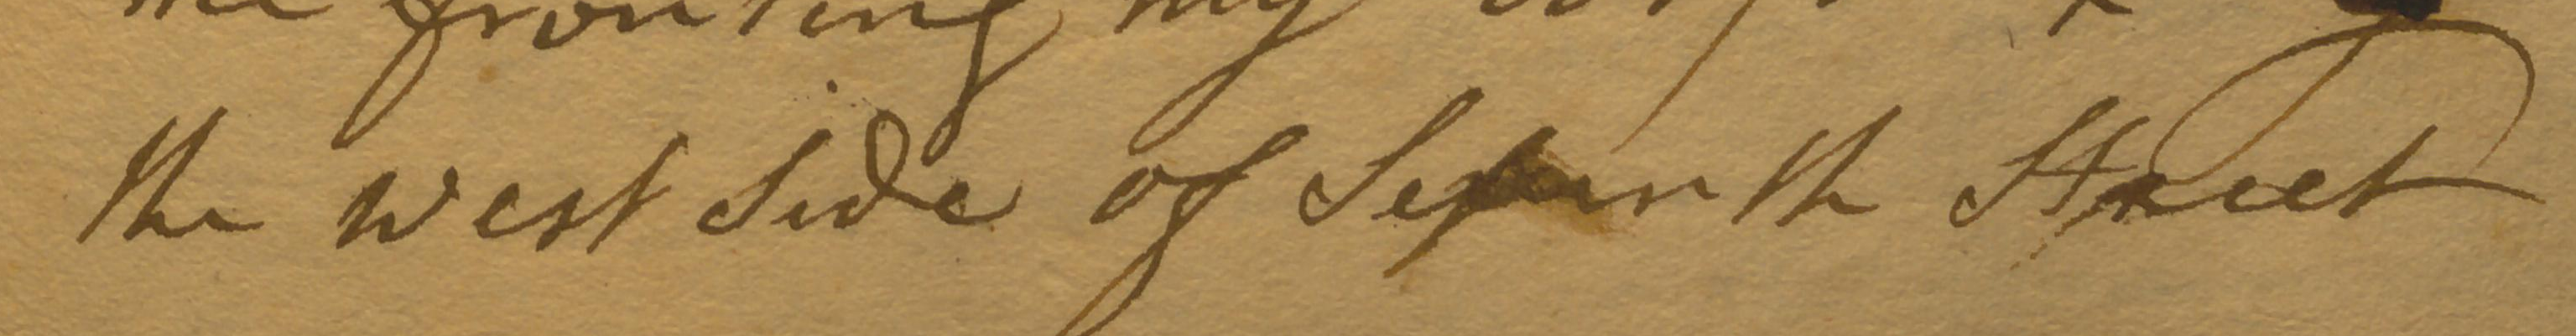the west side of Seventh Street
